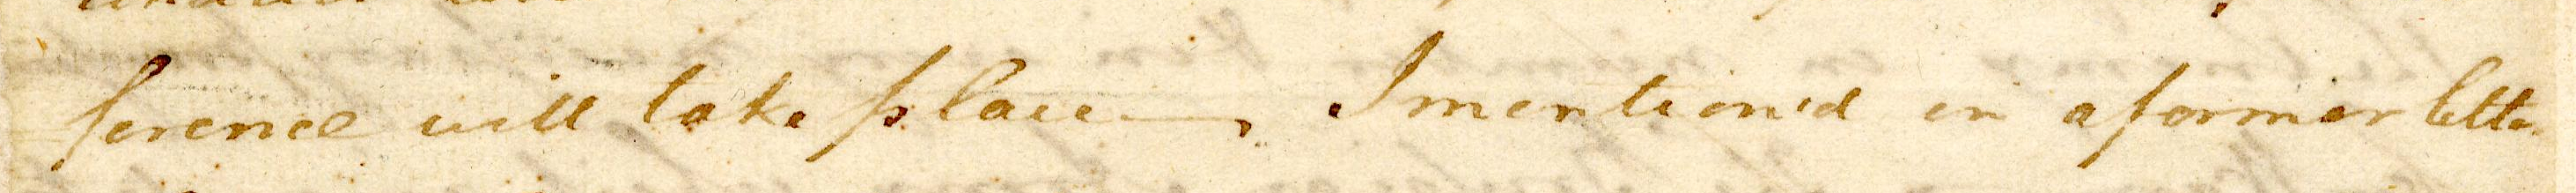ference will take place- I mention'd in a former letter
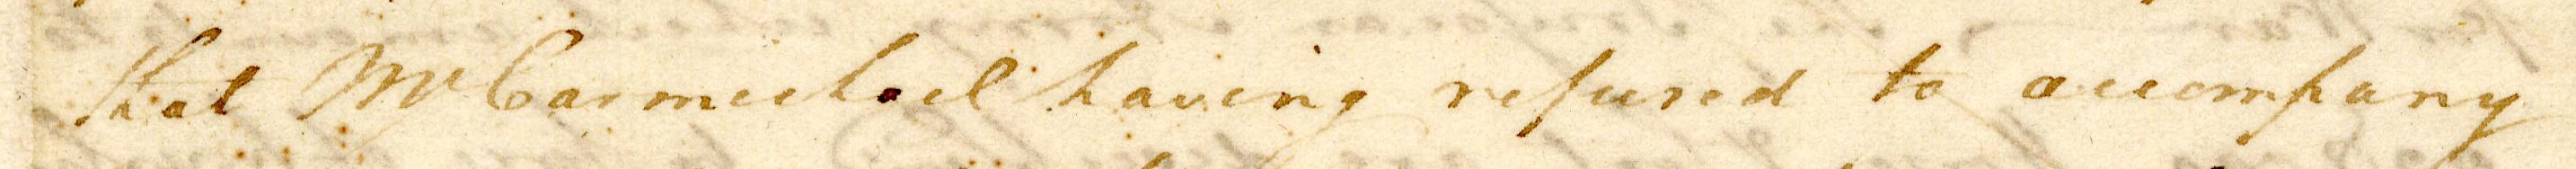that M^r Carmichael having refused to accompany
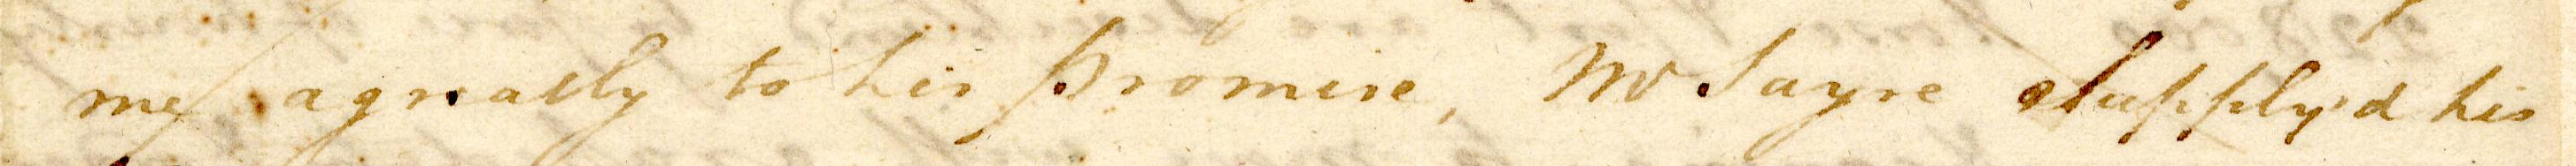me agreeably to his Promise, M^r Sayre supply'd his
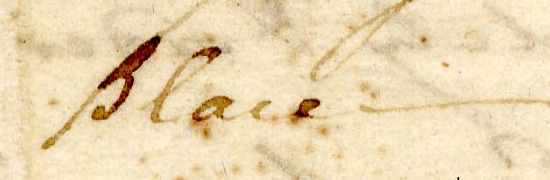place-
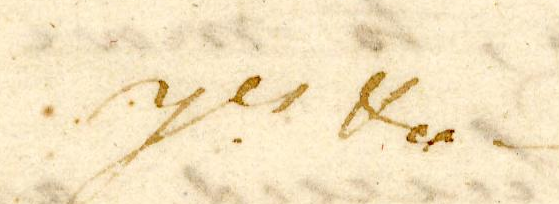y^rs. &ca
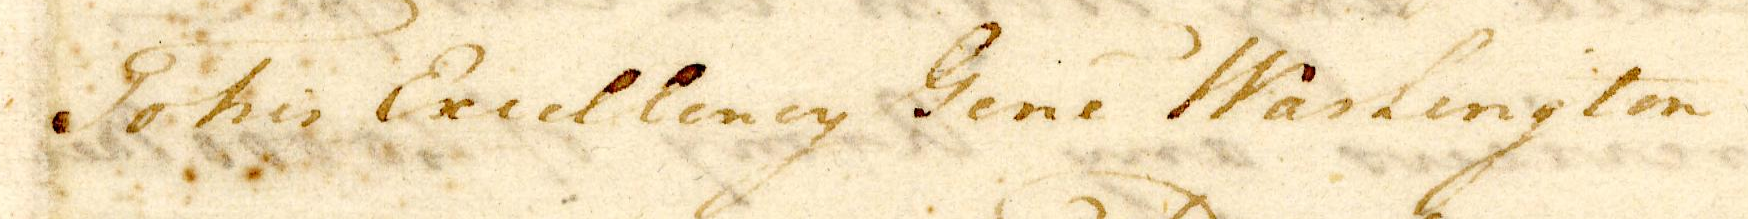To his Excellency Gene Washington
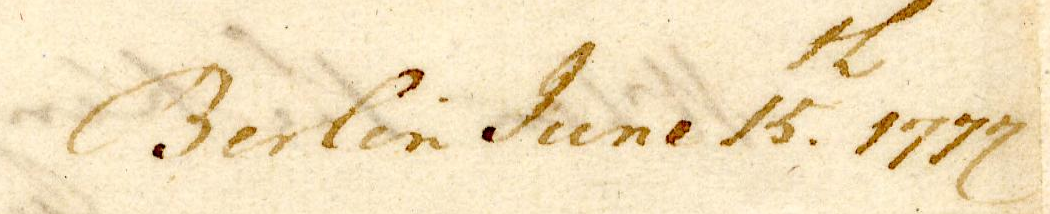Berlin June 15^th. 1777
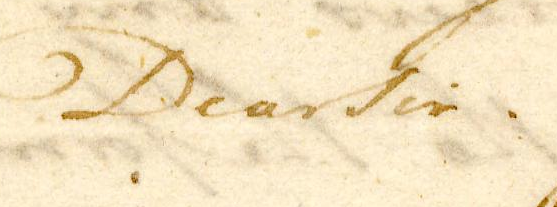Dear Sir,
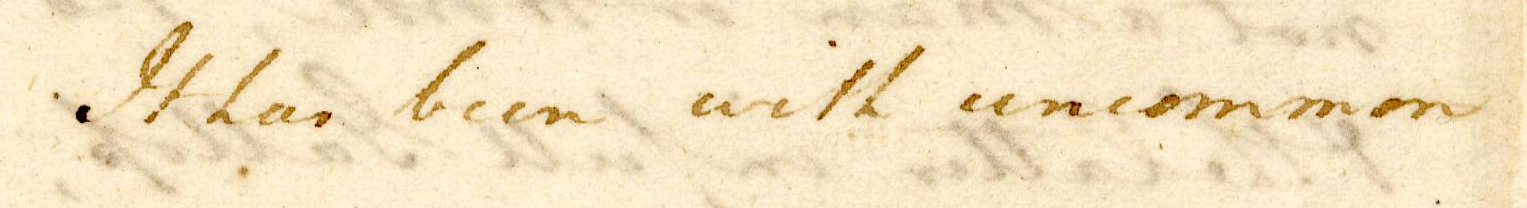It has been with uncommon
